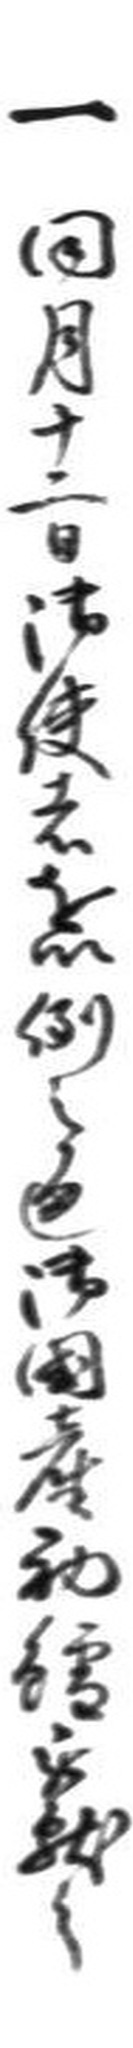一同月十二日御使者を以例之通御国産初鱈被献之
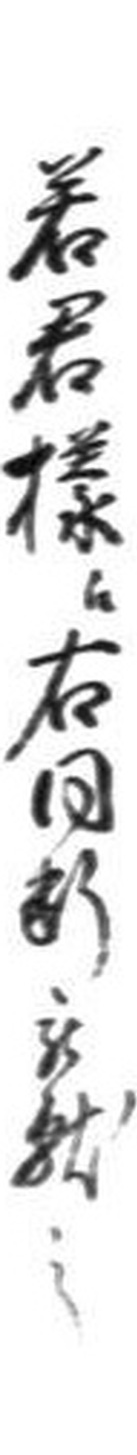若君様江右同断被献之
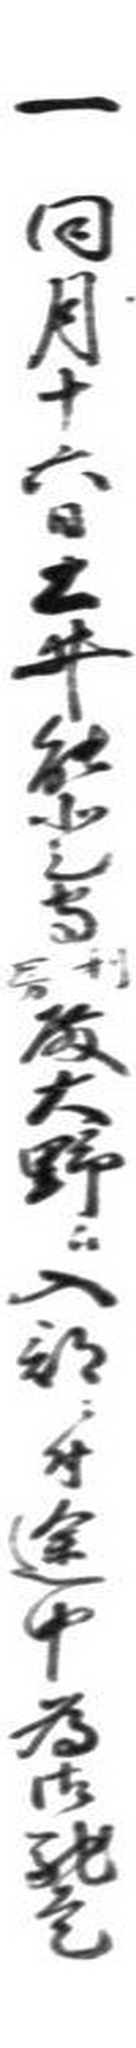一同月十六日土井能登守利房殿大野江入部ニ付途中為御馳走
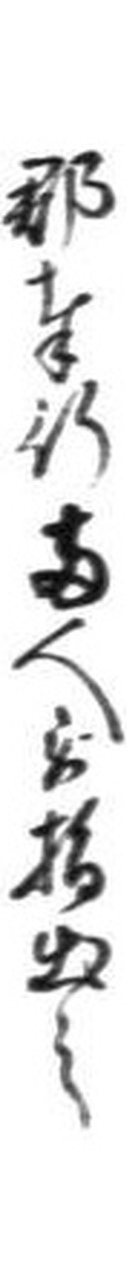郡奉行両人被指出之
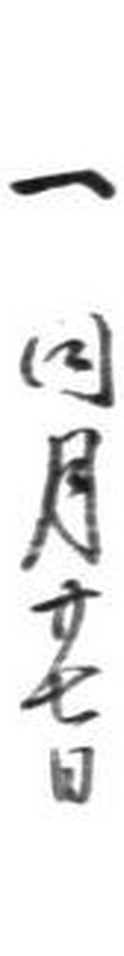一同月廿七日
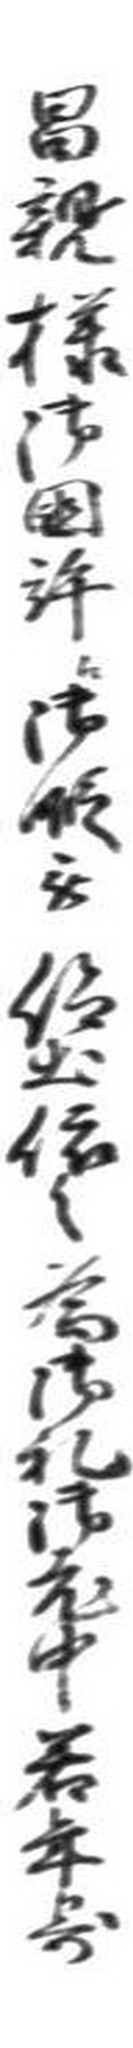昌親様御国許江御暇被仰出依之為御礼御老中若年寄

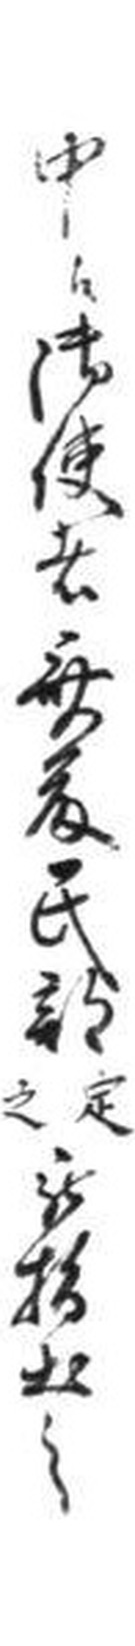中江御使者斎藤民部定之被指出之
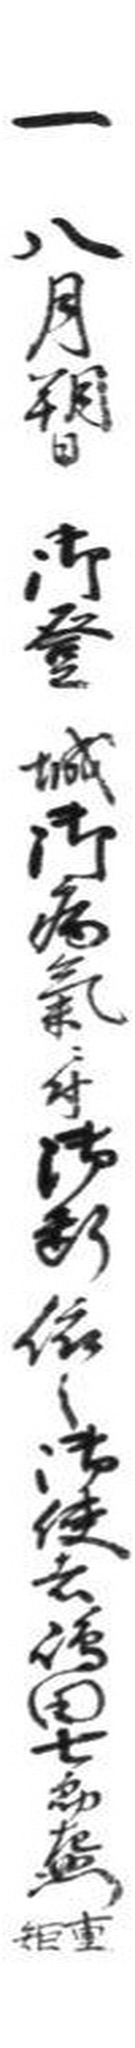一八月朔日御登城御病気ニ付御断依之御使者嶋田七郎左衛門重矩
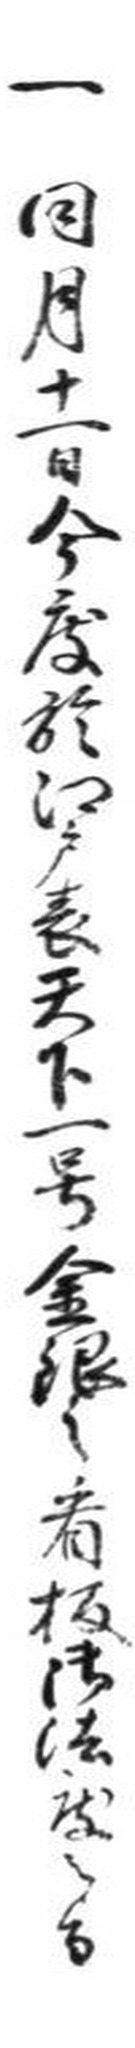一同月十一日今度於江戸表天下一号金銀之看板御法度之旨
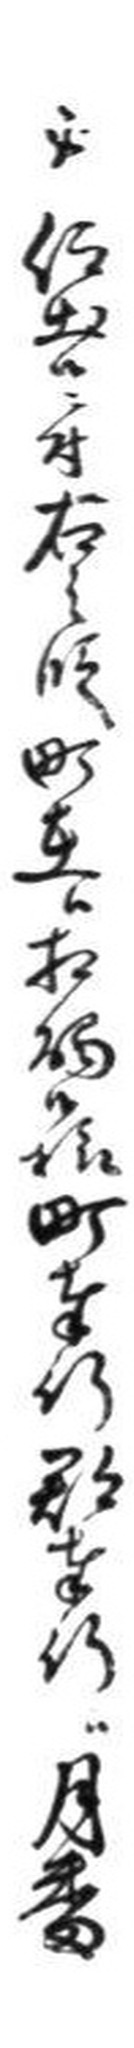被仰出候ニ付右之段町在江相触候様町奉行郡奉行江月番
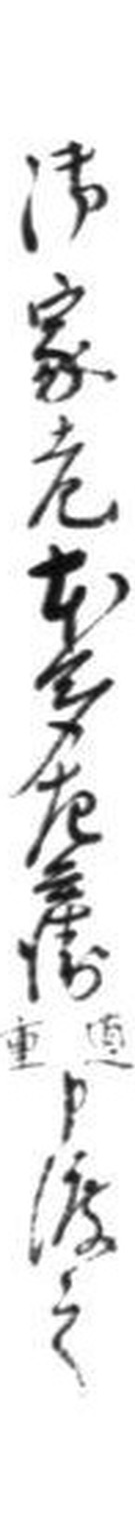御家老本多左兵衛道重申渡之
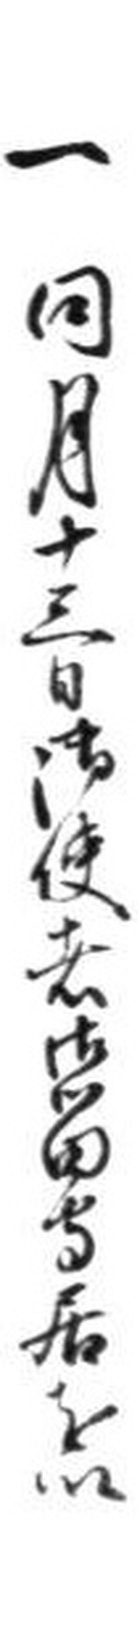一同月十三日御使者御留守居を以
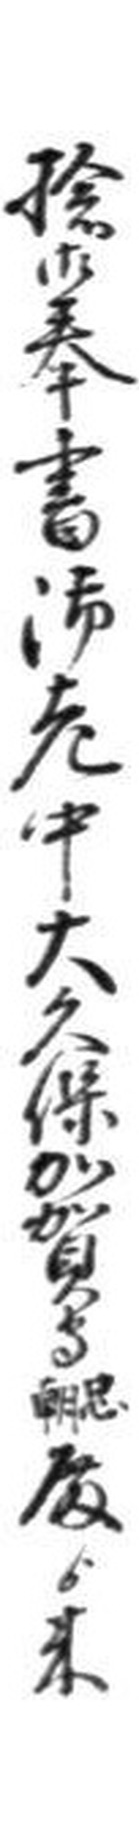捻御奉書御老中大久保加賀守忠朝殿ゟ来
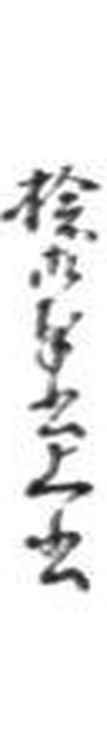捻御奉書上書
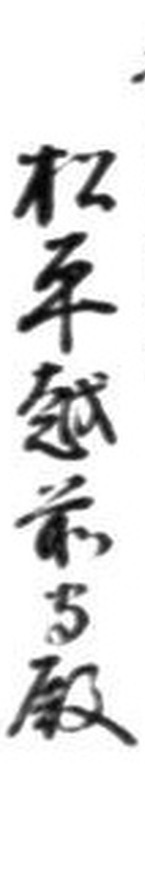松平越前守殿忠朝
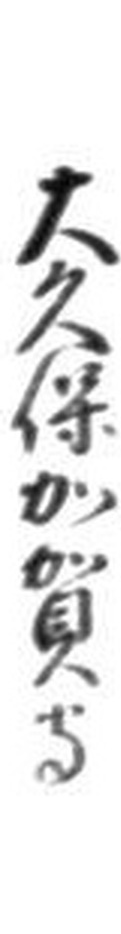大久保加賀守
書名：家譜 十五 綱昌公 従天和元年到元禄十二年
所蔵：福井県文書館 Fukui Prefectural Archives
